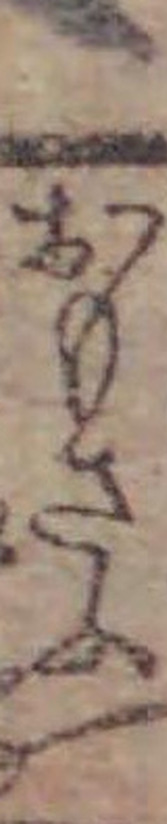おもさふ
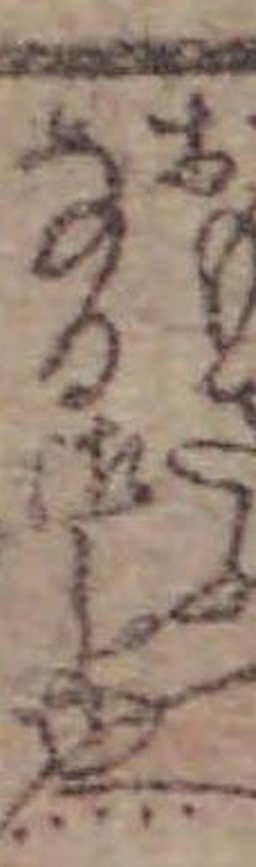なる御しゆ

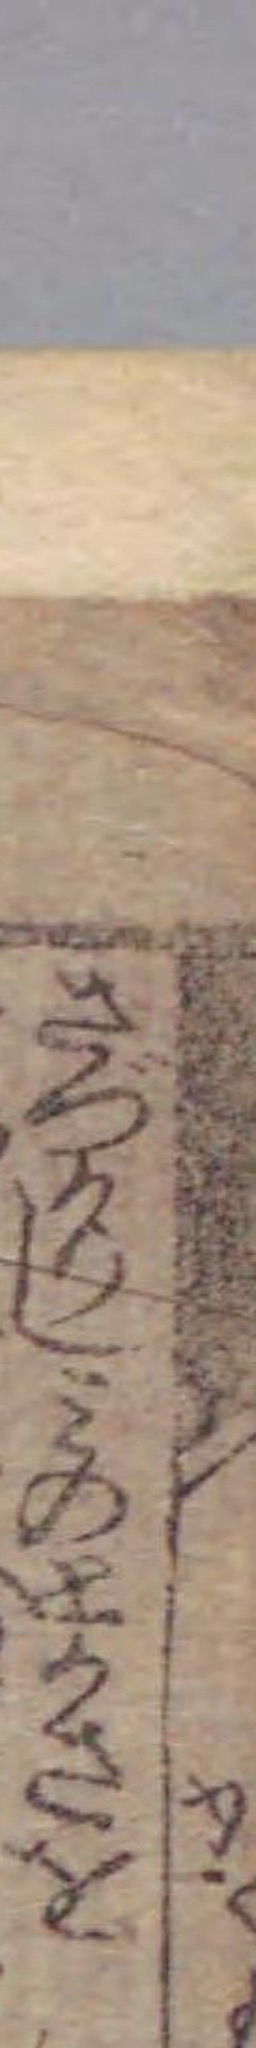さづかりしみのとかさを
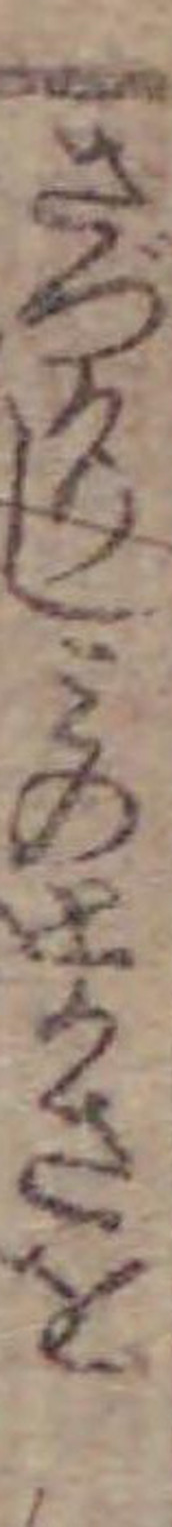さづかりしみのとかさを
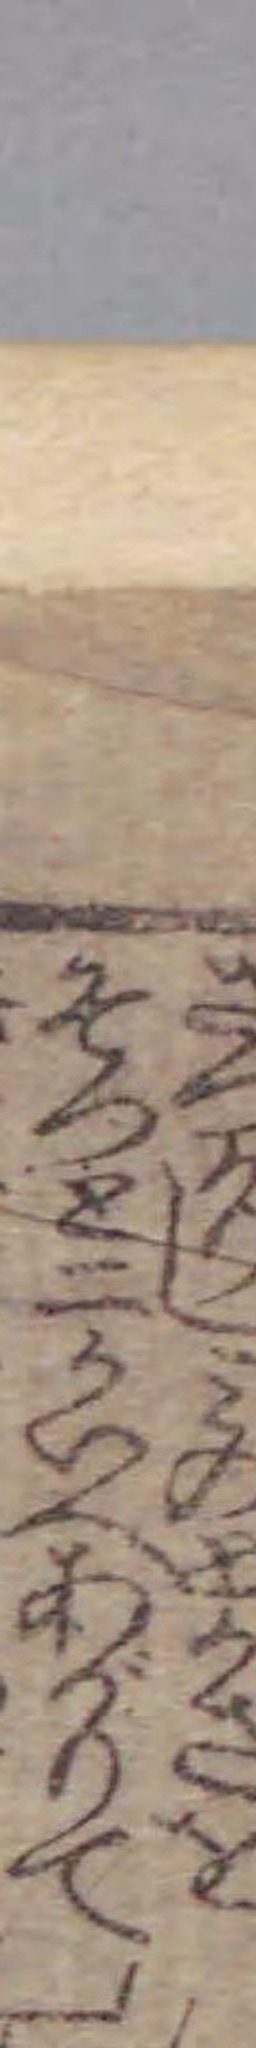そつと二かいへあがりて
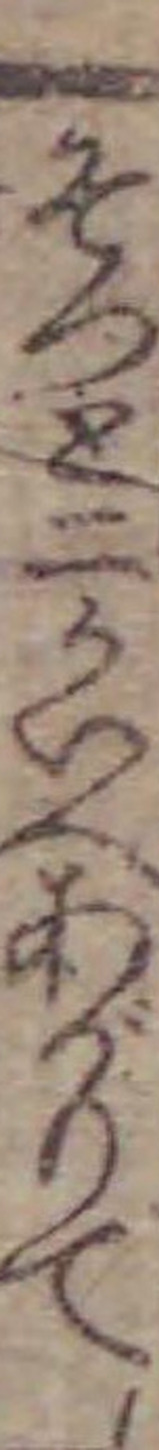そつと二かいへあがりて
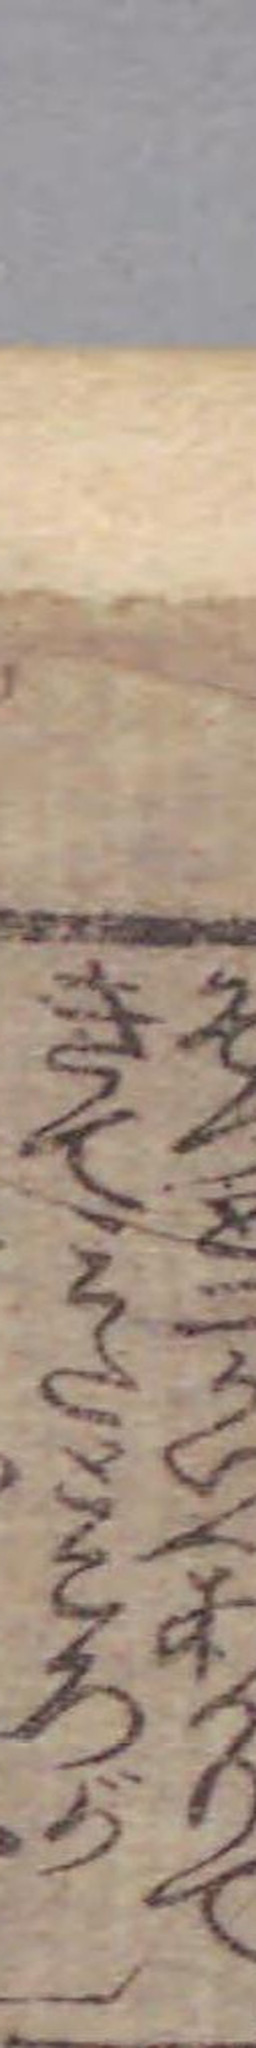きてみたところが
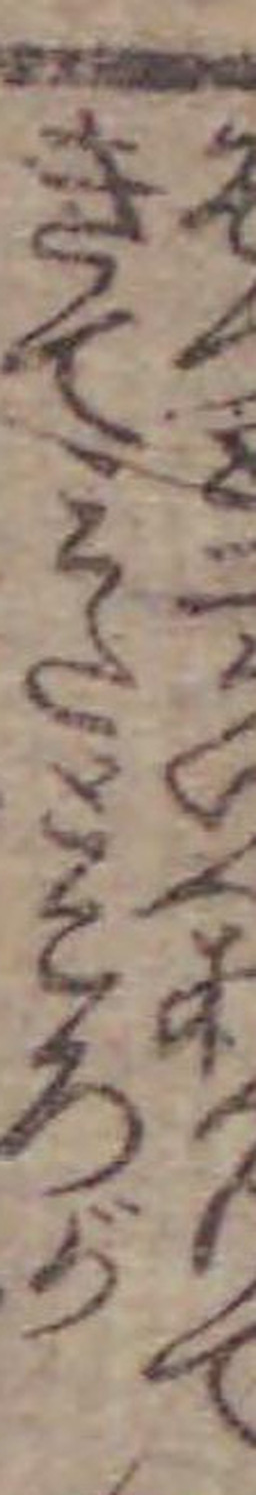きてみたところが
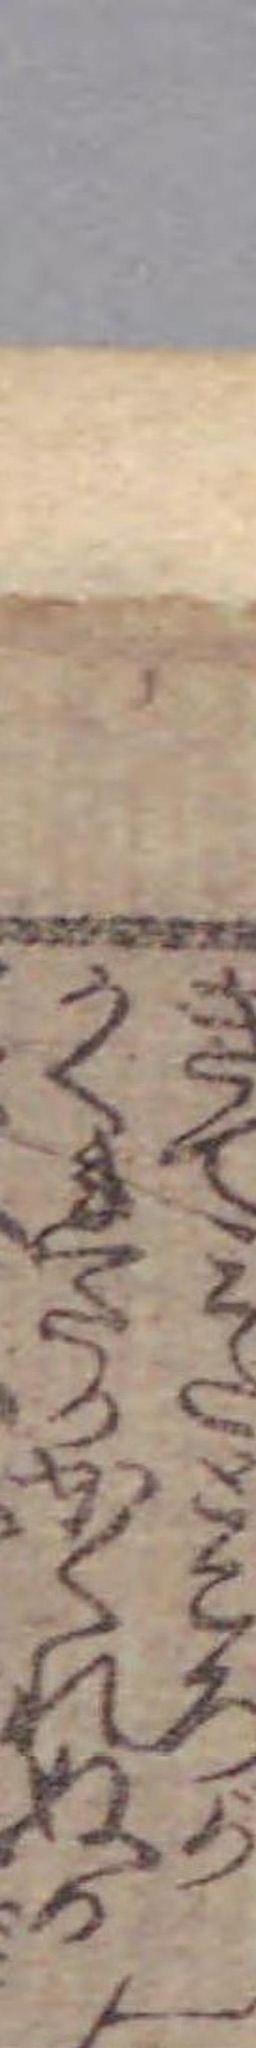かくれたかかくれぬか
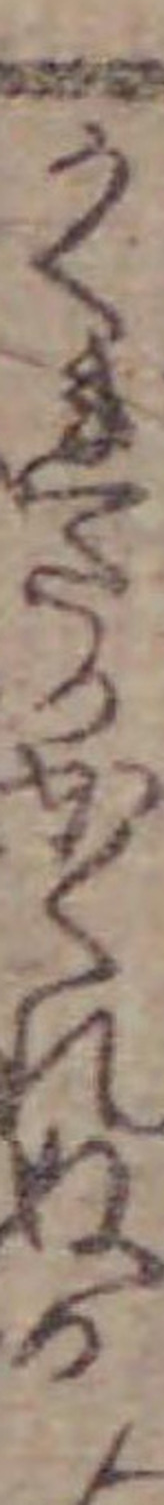かくれたかかくれぬか
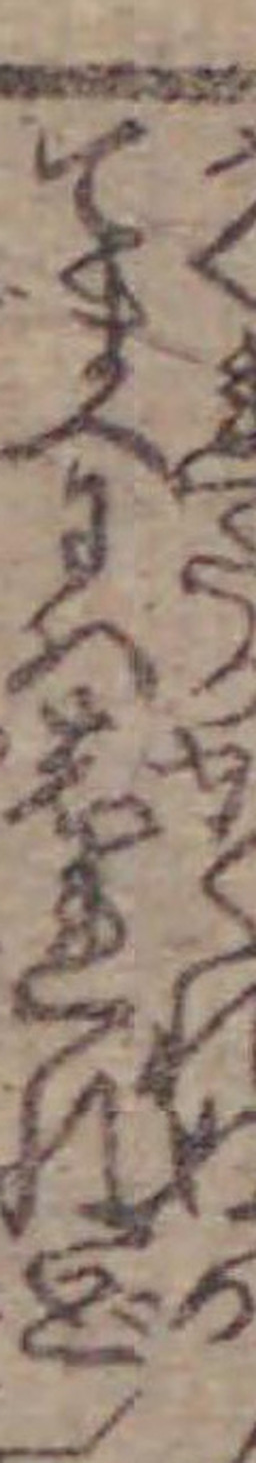てまへにはしれねど
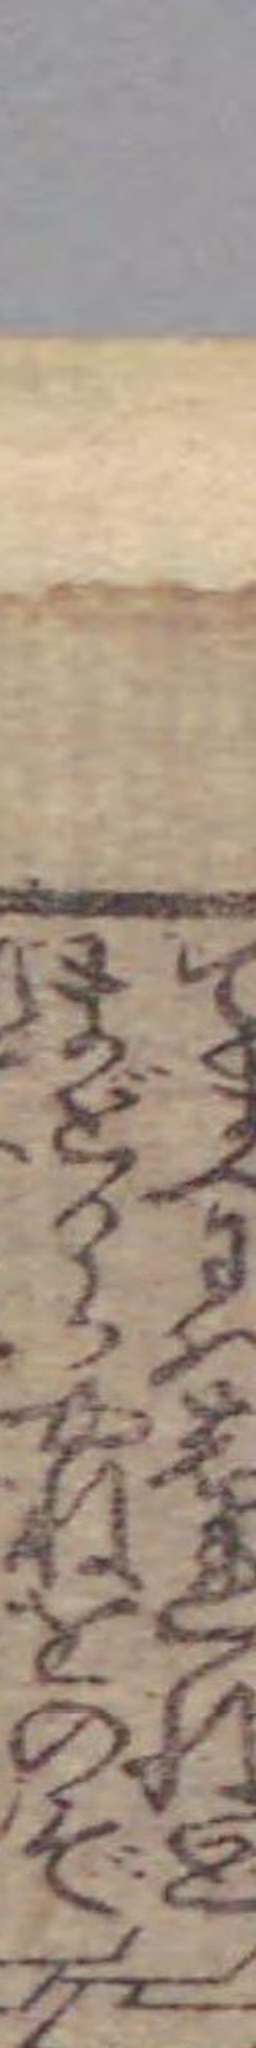まどからうあねをのぞ
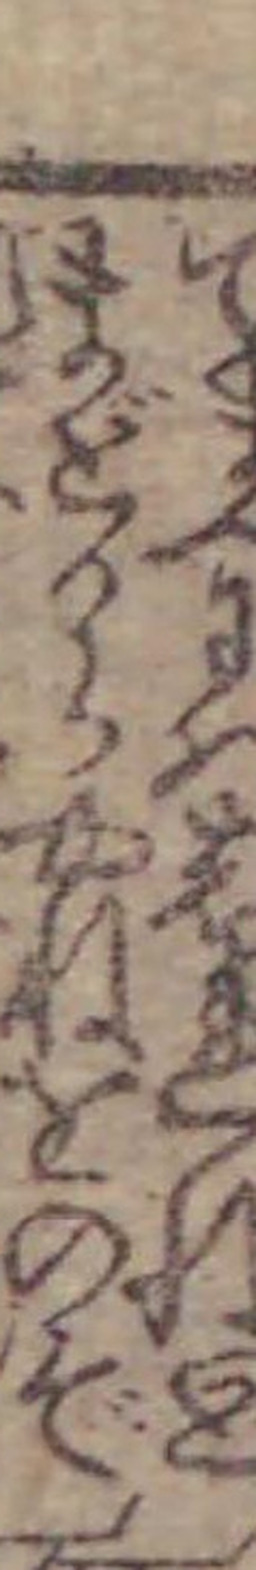まどからうあねをのぞ
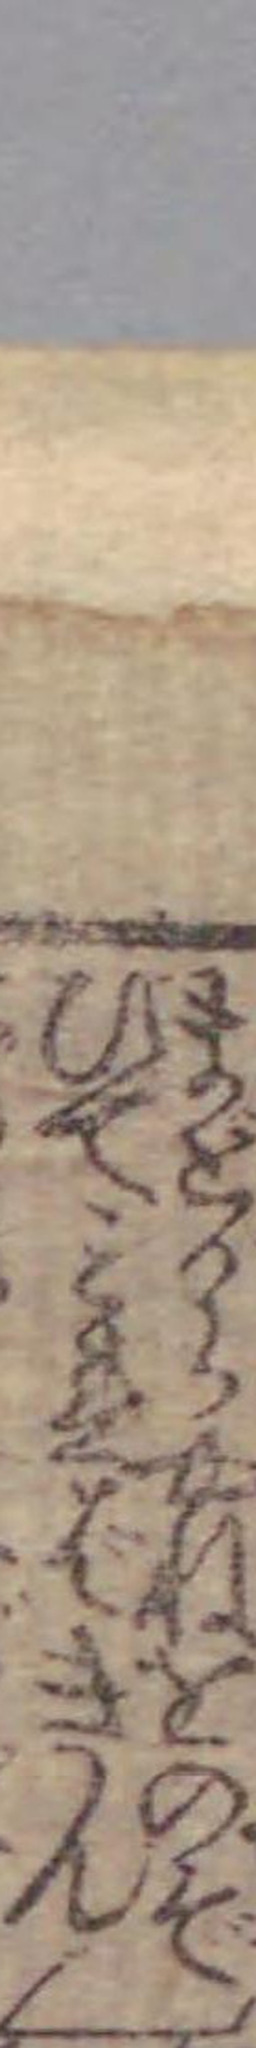ひてみればきん
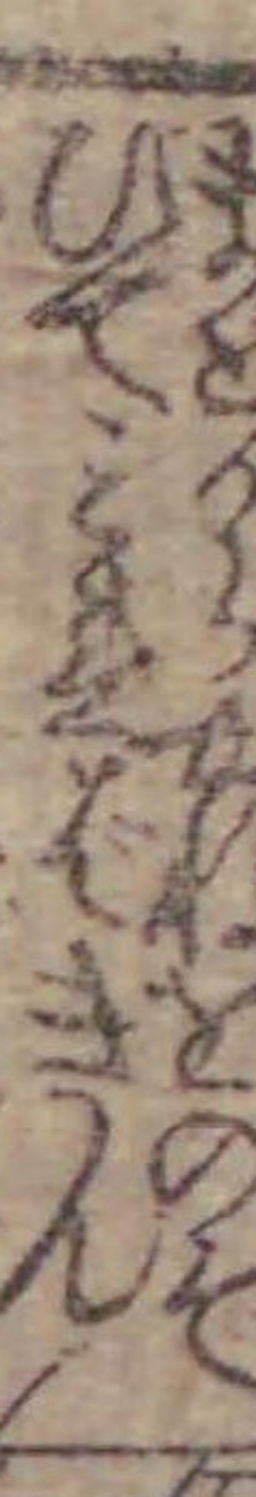ひてみればきん
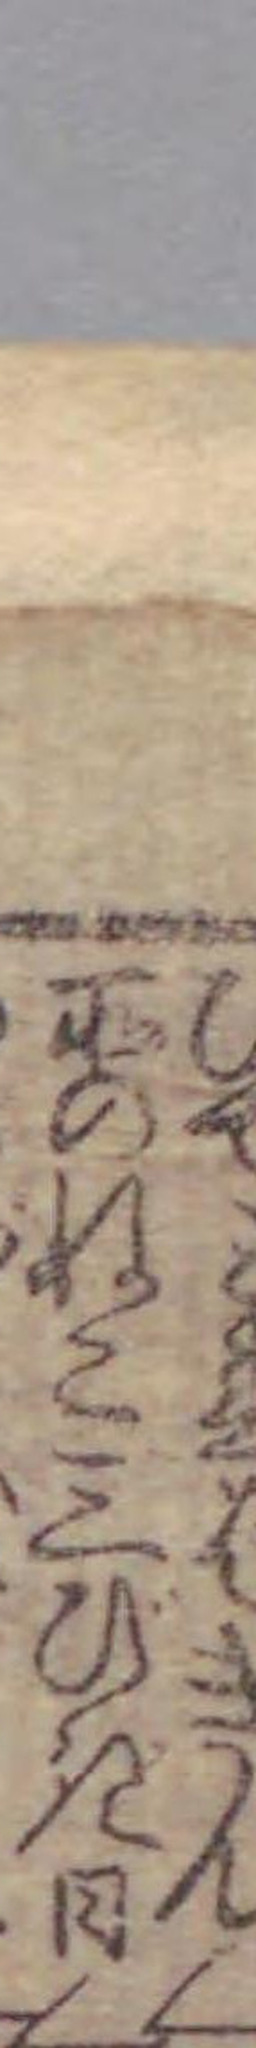所のねこ三びき日
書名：即席耳学問 : 3巻
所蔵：国立国会図書館 National Diet Library, JAPAN
